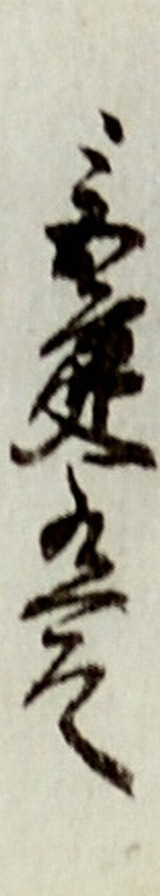宮建有之
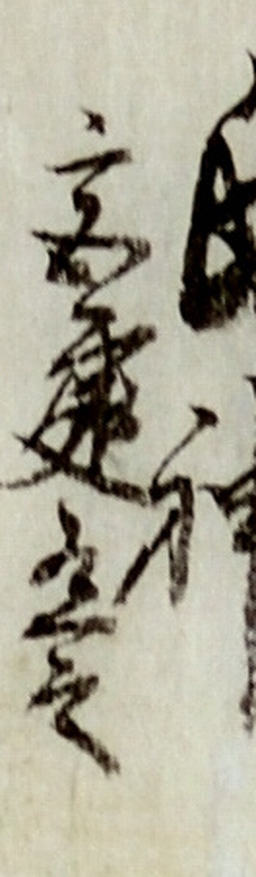宮建有之
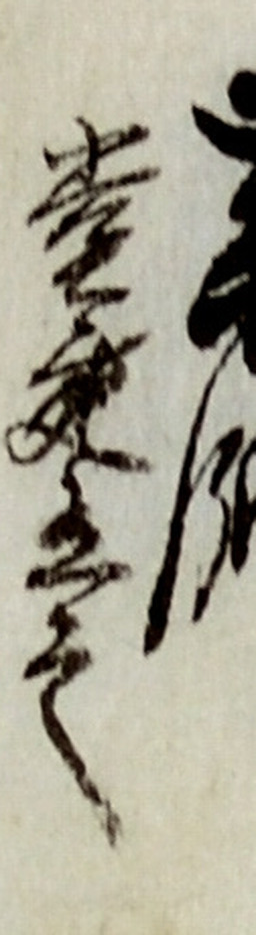宮建有之

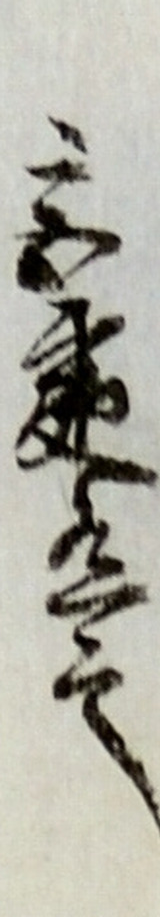宮建有之
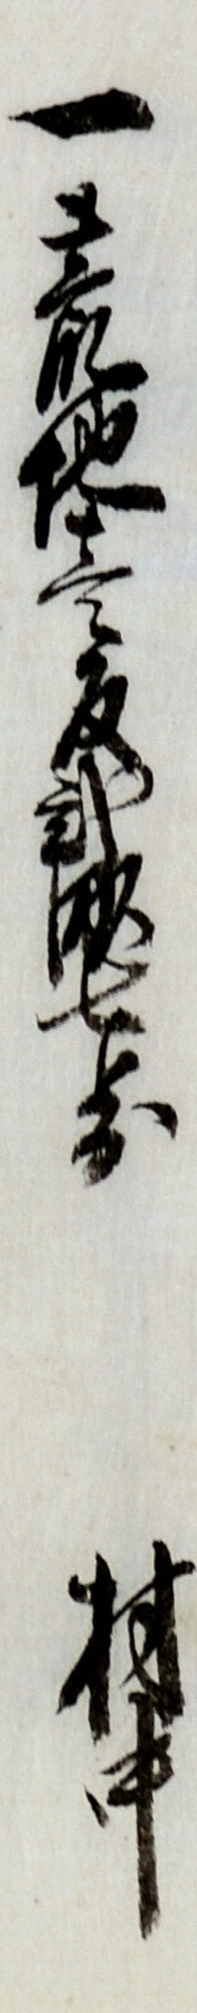一荒地壱反弐畝七歩村中
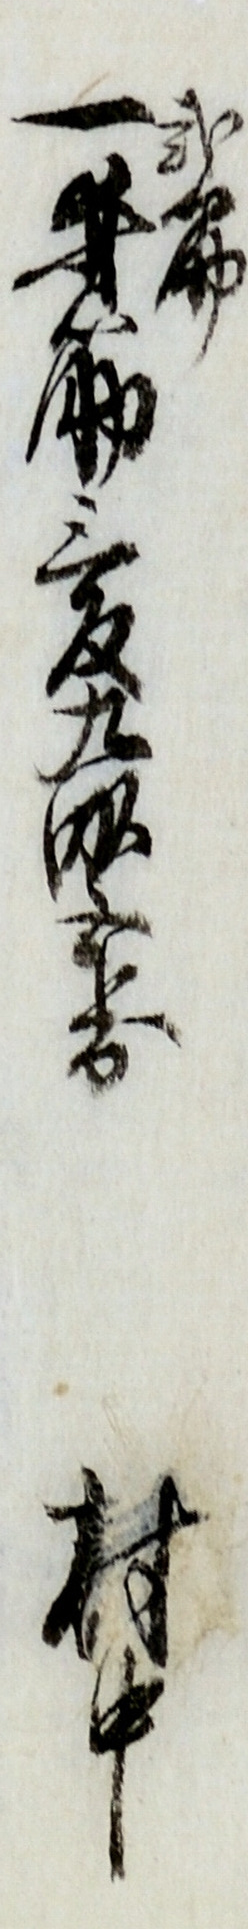一井筋三反九畝五歩村中
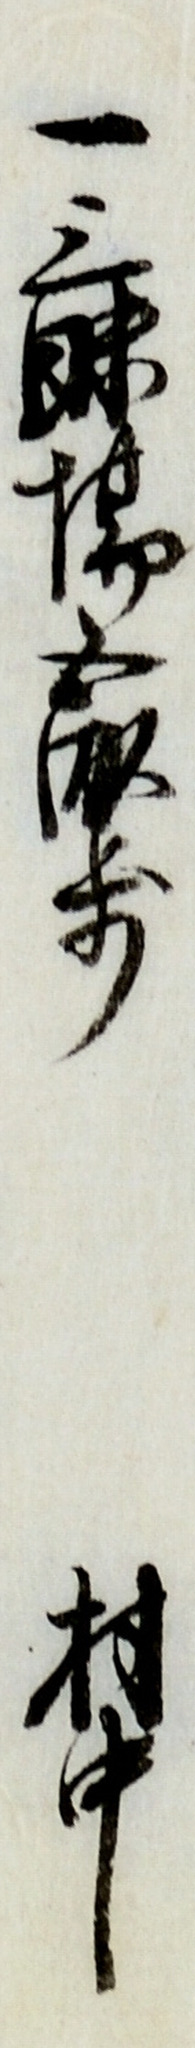一三昧場五畝歩村中
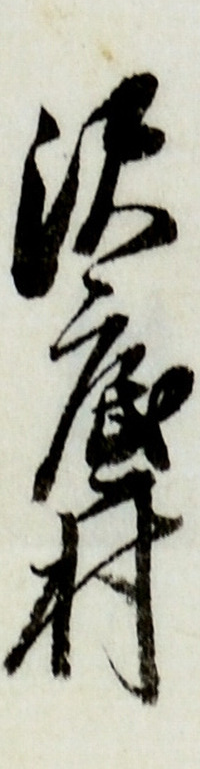沢底村
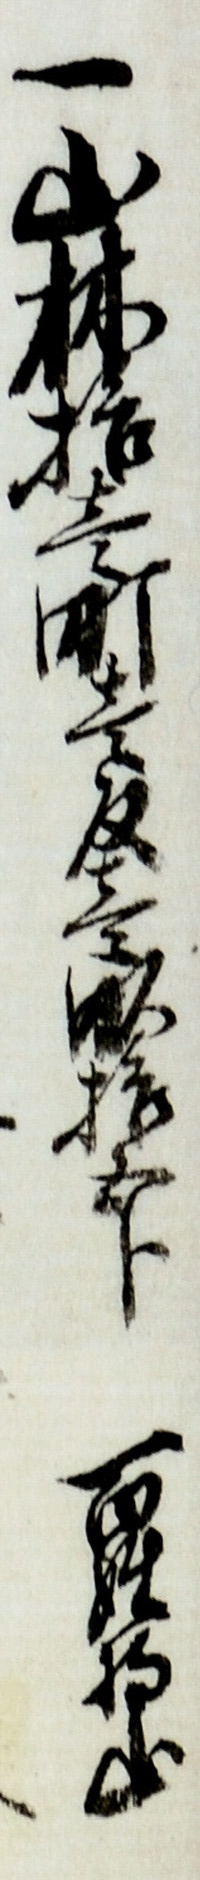一山林拾壱町壱反壱畝拾五歩百姓持山
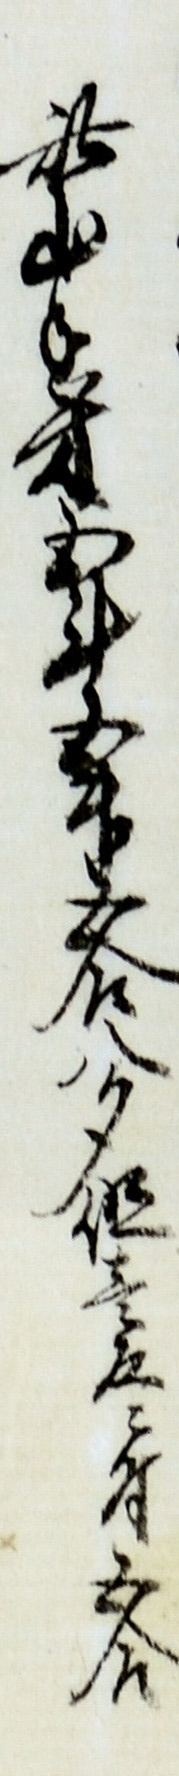此山手米五斗五升五合八勺但壱反ニ付五合

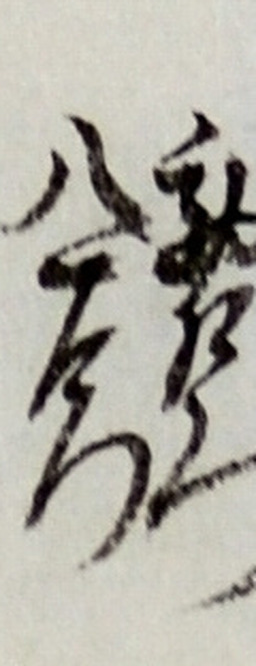兵右衛門
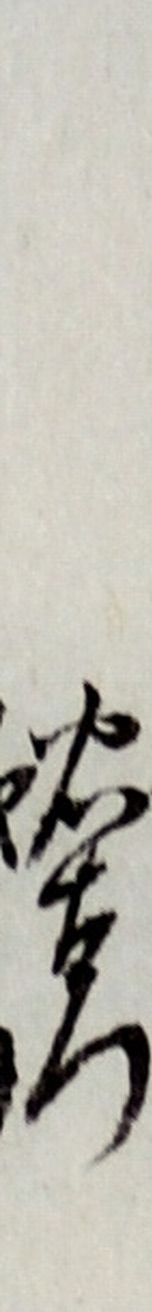兵右衛門
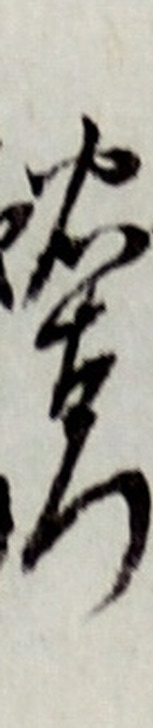兵右衛門
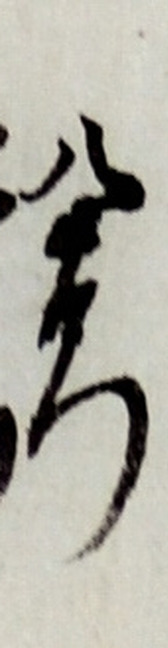兵右衛門
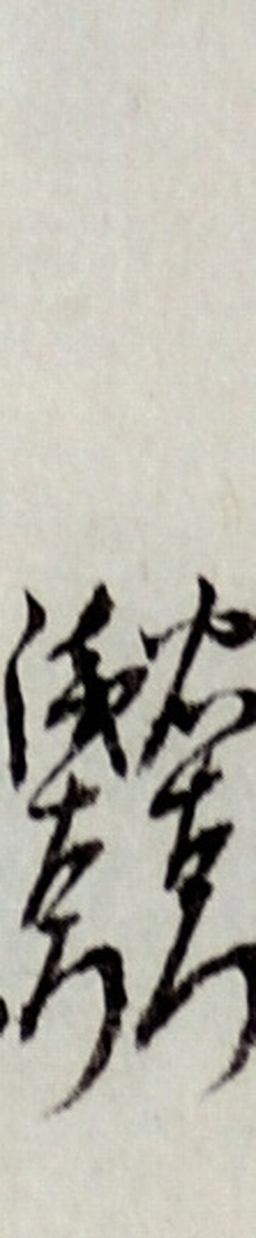兵右衛門
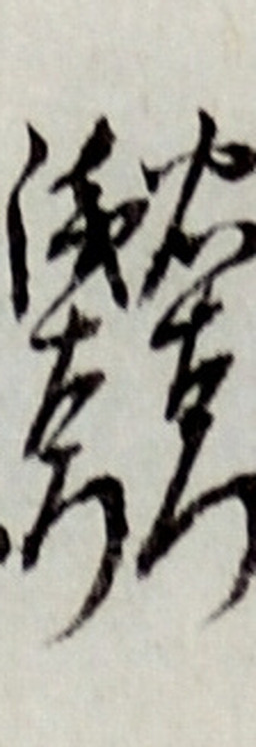兵右衛門
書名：御領分中山林社地手控
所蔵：伊那市立高遠町図書館・合同会社AMANE
